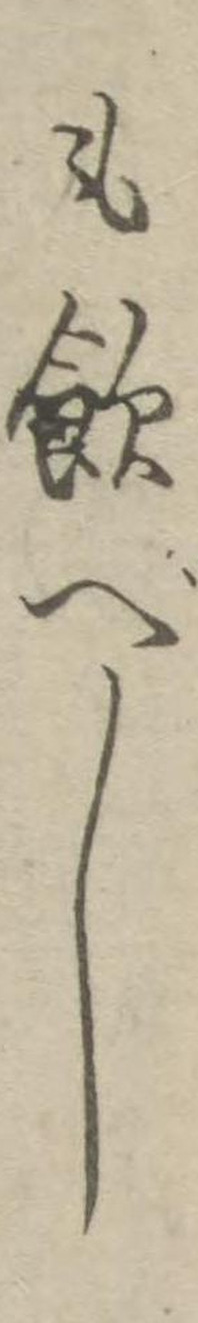も飲べし
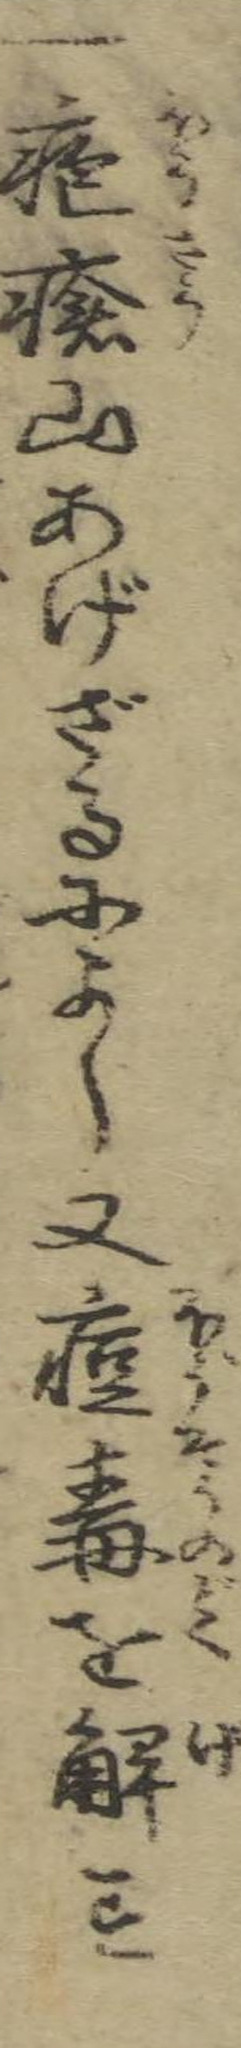一疱瘡山あげざるによし又痘毒を解す

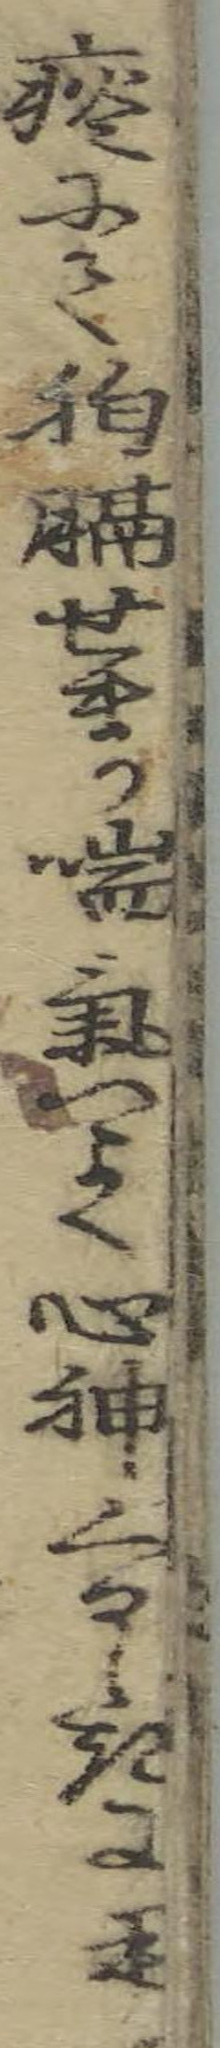一痰にて胸膈せまり喘気つよく心神くるしきに用て
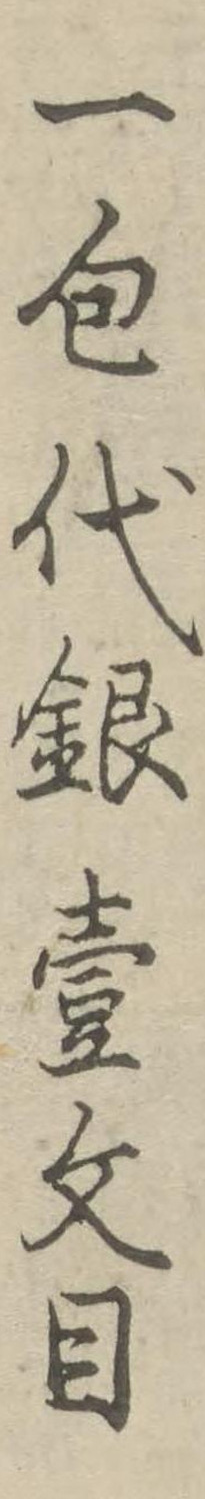一包代銀壱文目
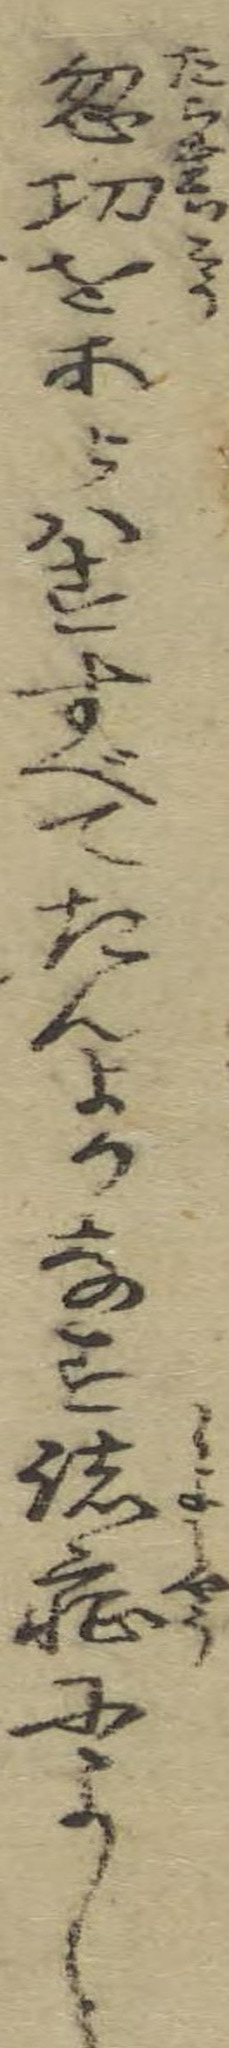忽功をあらはすすべてたんよりなす諸症によし
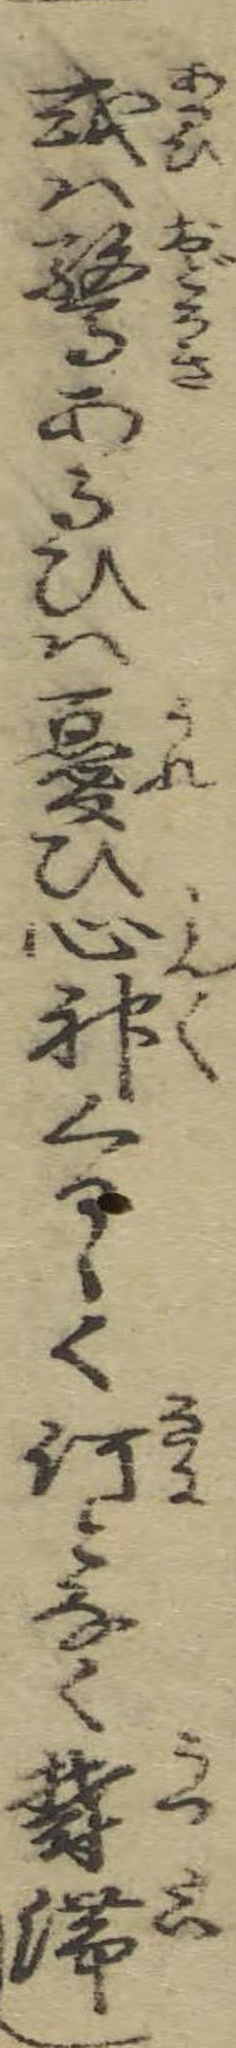一或は驚あるひは憂ひ心神くるしく何となく欝滞し
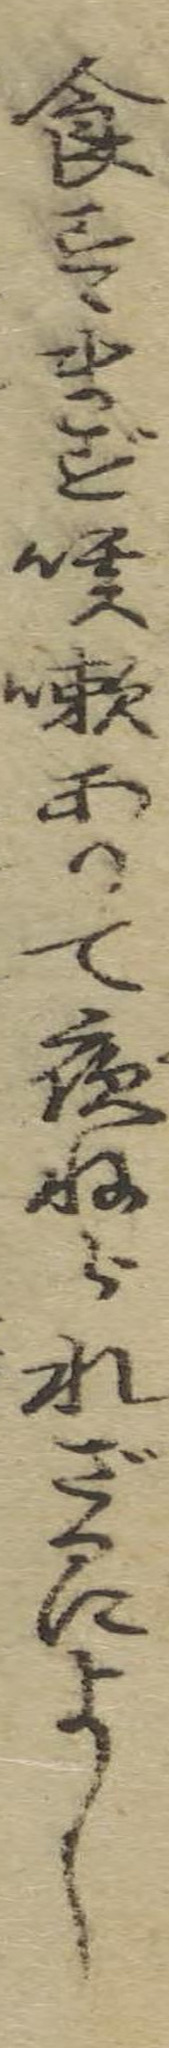食すゝまず咳嗽ありて夜ねられざるによし
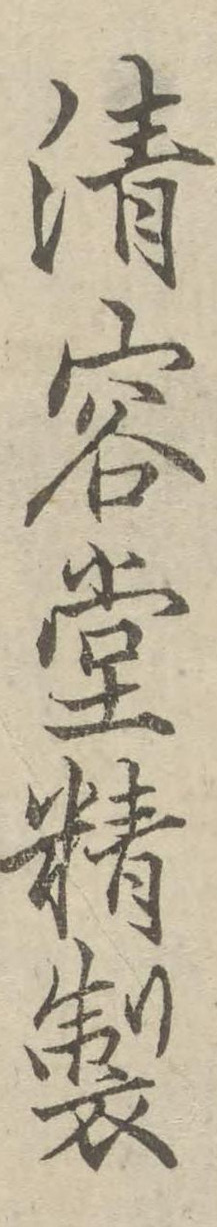清容堂精製
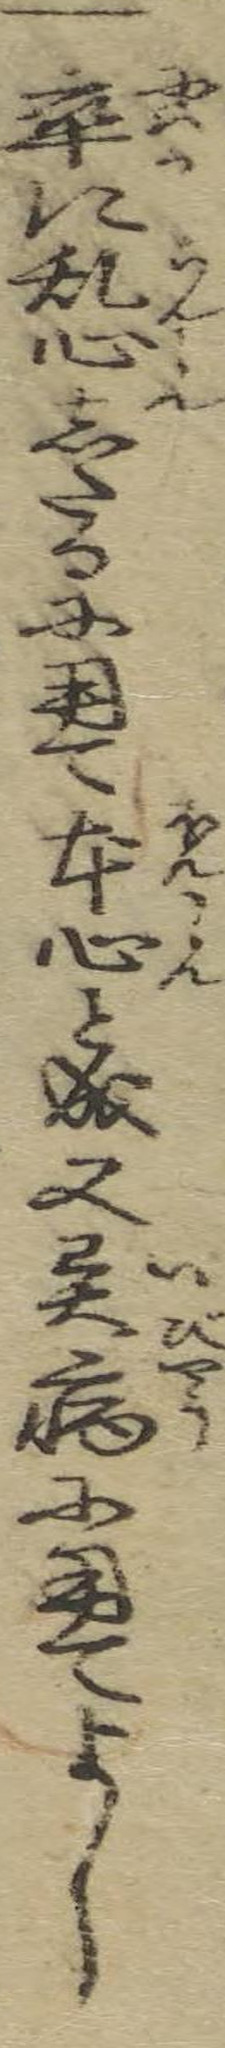一卒に乱心したるに用て本心と成又異病に用てよし
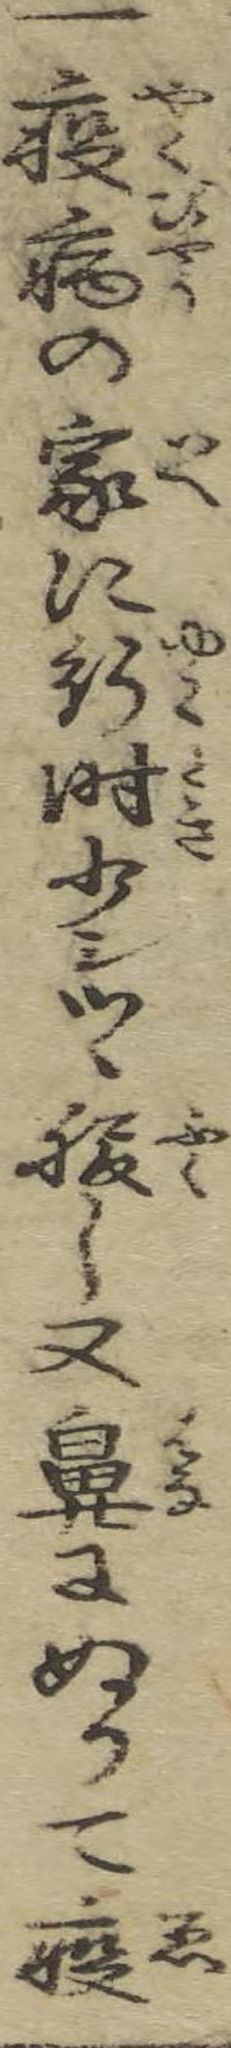一疫病の家に行時少しつゝ服し又鼻にぬりて疫
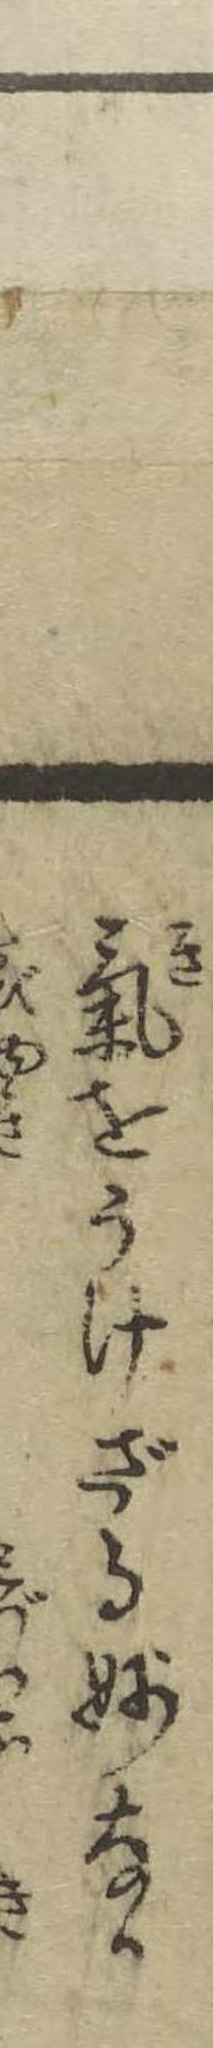気をうけざる妙なり
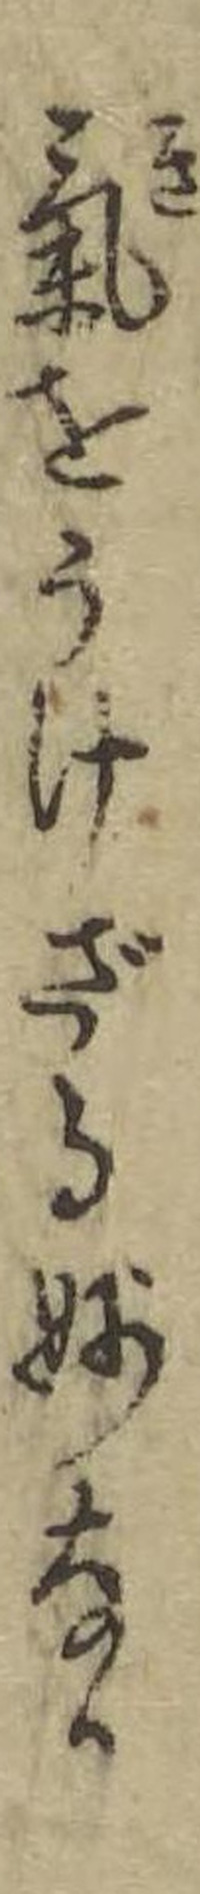気をうけざる妙なり
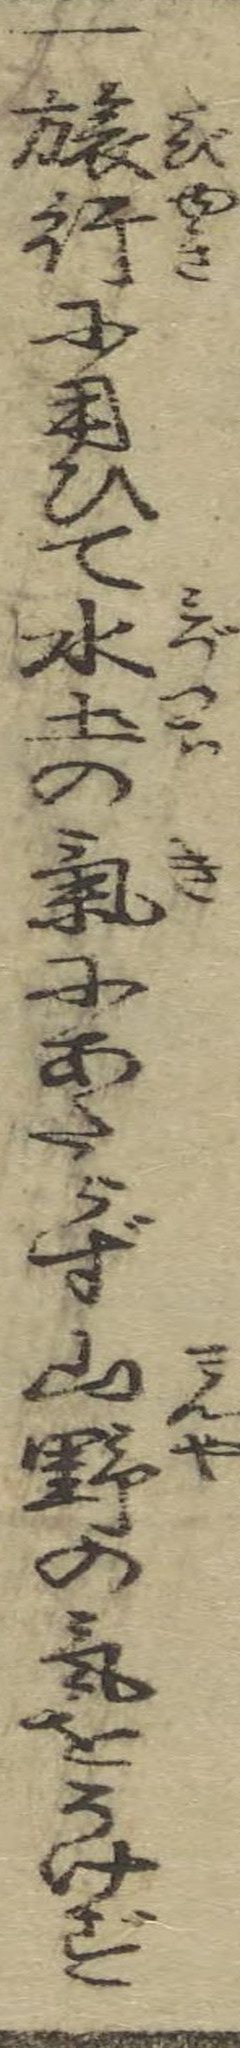一旅行に用ひて水土の気にあたらず山野の気をうけず
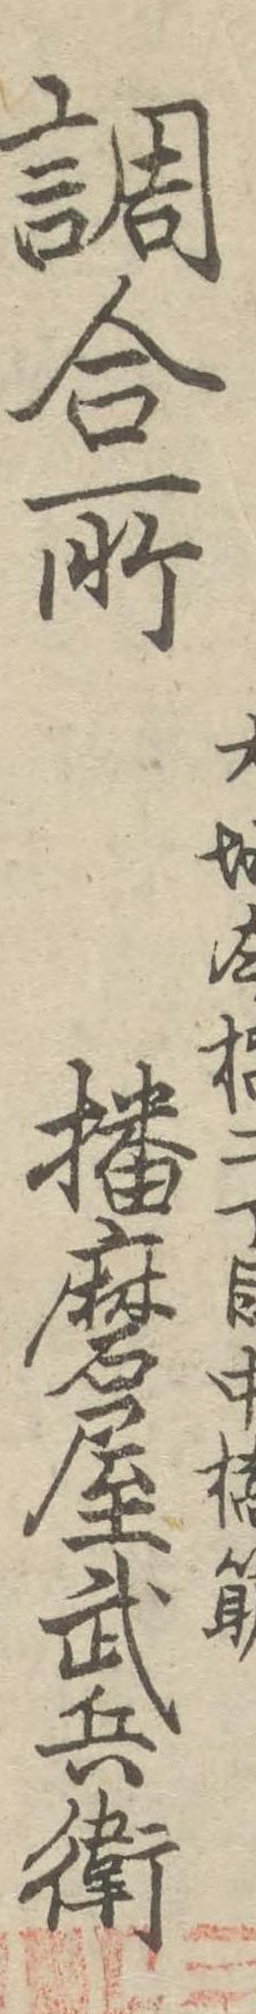調合所播磨屋武兵衛
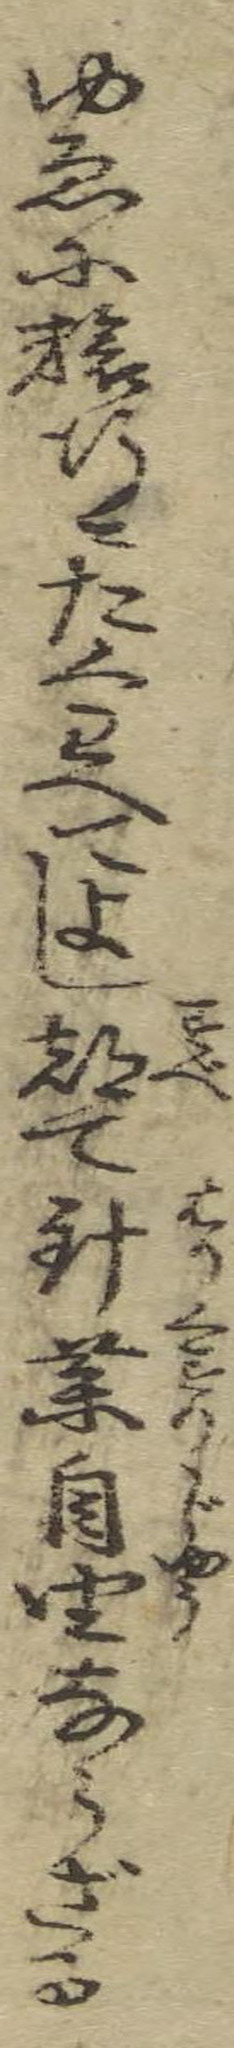ゆゑに旅行にたくわへてよし都て針薬自由ならざる
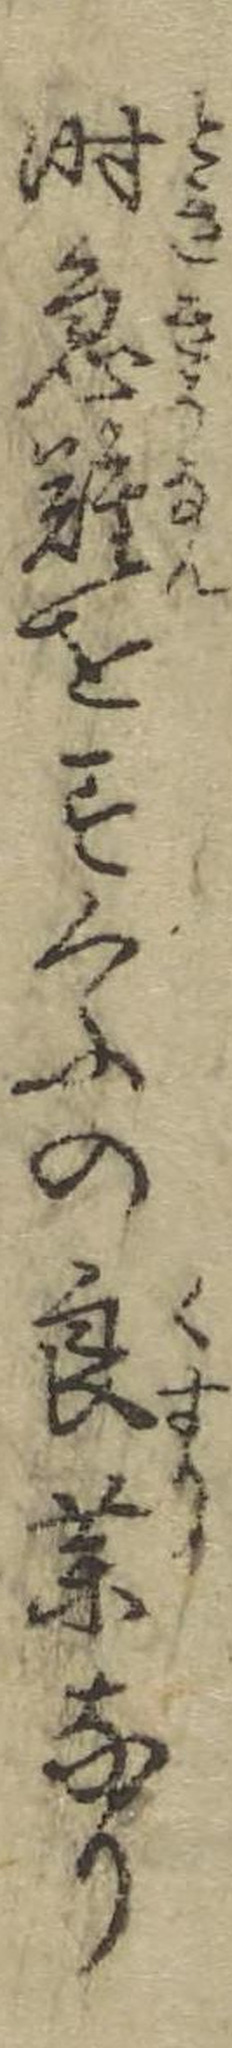時急難をすくふの良薬なり
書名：浪華薬種問屋能書張交帖. 二
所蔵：国立国会図書館 National Diet Library, JAPAN
